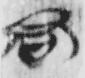君
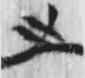之
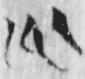州
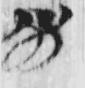加
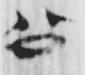公
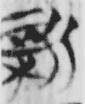新
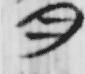月
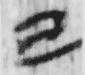己
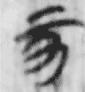亥
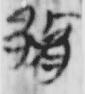○（宛）
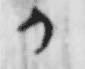人
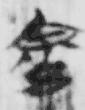舒
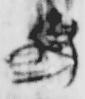○（夏）
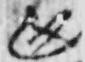臣
